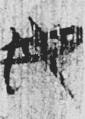母
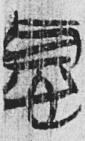怠（怠）
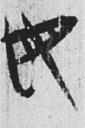母
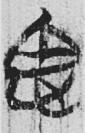思
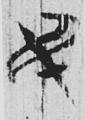民
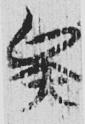矣（疑）
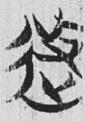﨤（及）
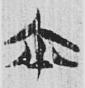尔
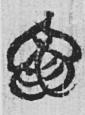龜
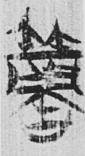○（策）
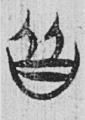皆
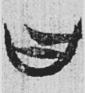曰
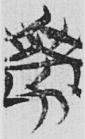○（勝）
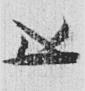之
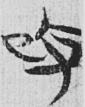改
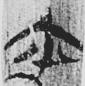尔
